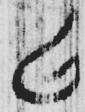㠯（以）
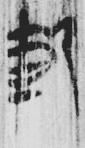○（犯）
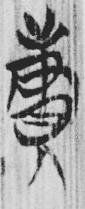賡
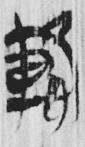○（犯）
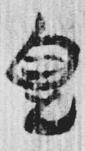見
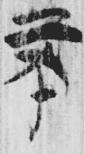不
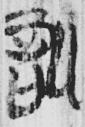訓
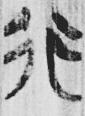行
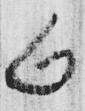㠯（以）
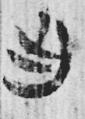出
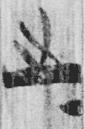之
